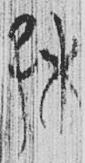杍（梓）
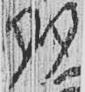多多
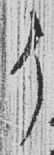人人
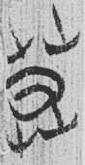莫
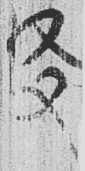奴（如）
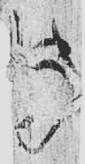同
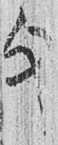父
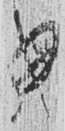母（母）
